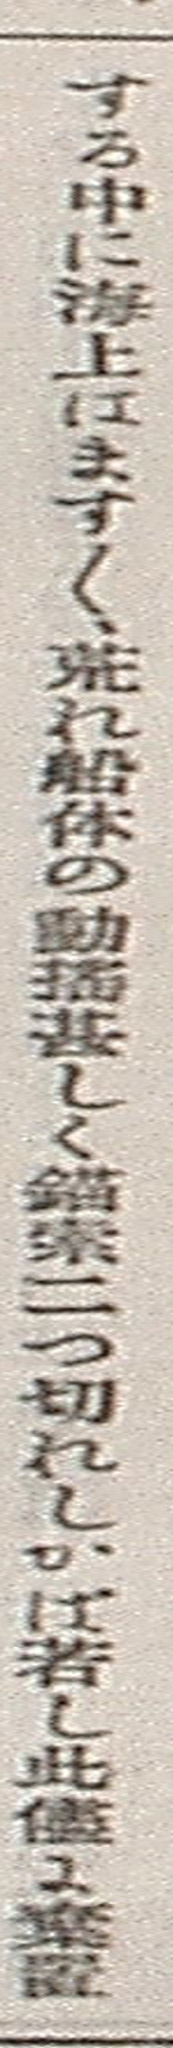する中に海上はます〳〵荒れ船体の動揺甚しく錨索二つ切れしかば若し此侭に棄置
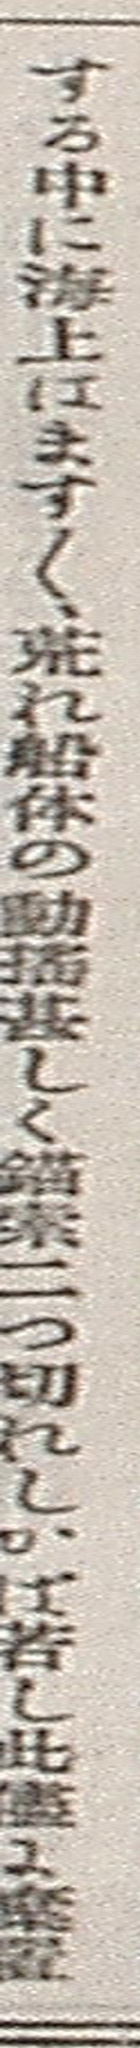する中に海上はます〳〵荒れ船体の動揺甚しく錨索二つ切れしかば若し此侭に棄置
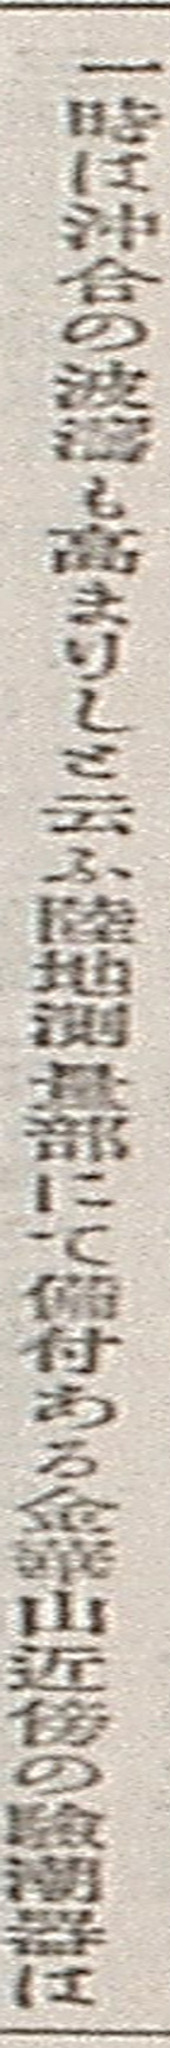一時は沖合の波濤も高まりしと云ふ陸地測量部にて備付ある金華山近傍の験潮器は
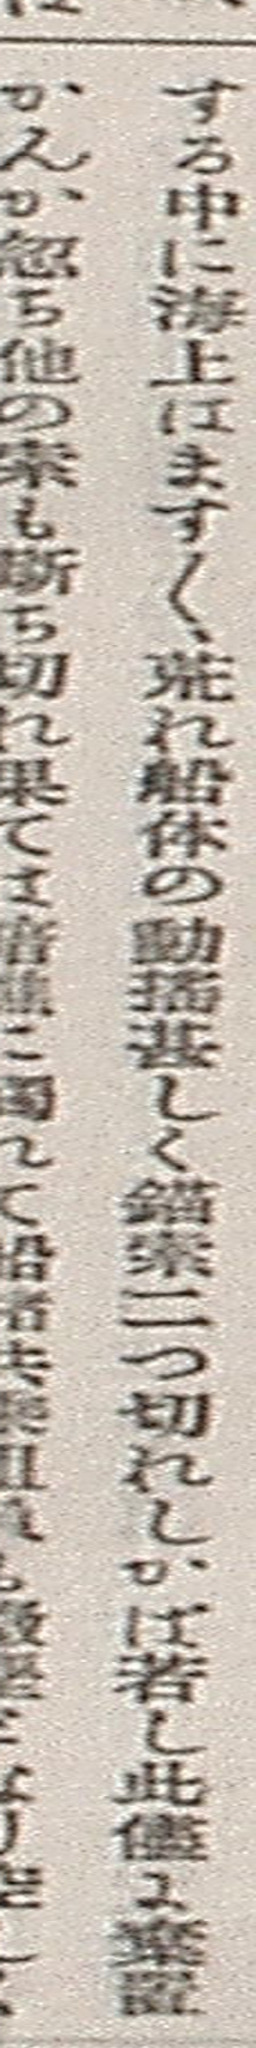かんか忽ち他の索も断ち切れ果ては暗礁に触れて船諸共乗組員も微塵となり空しく
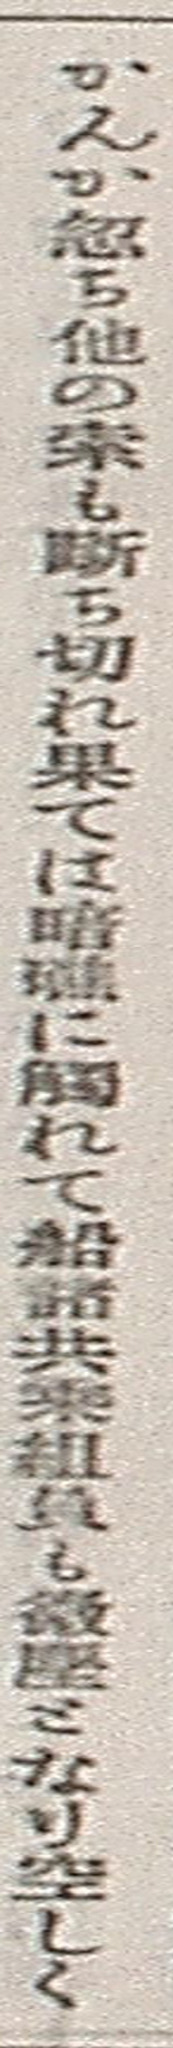かんか忽ち他の索も断ち切れ果ては暗礁に触れて船諸共乗組員も微塵となり空しく
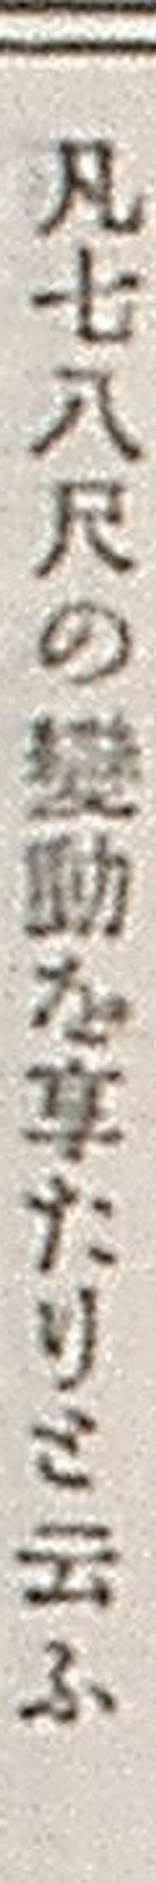凡七八尺の変動を享たりと云ふ
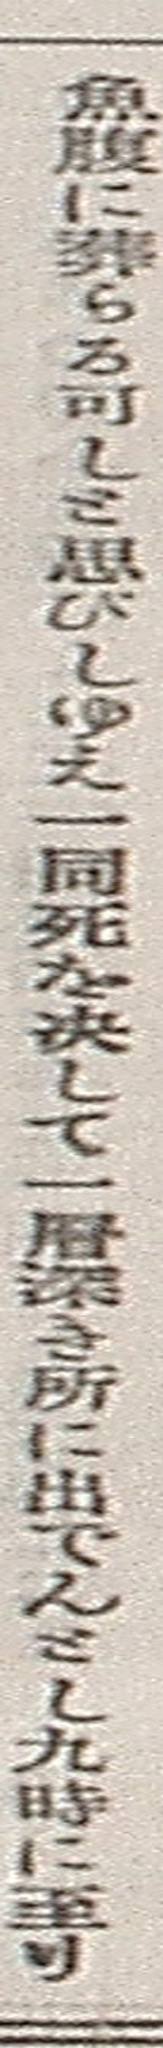魚腹に葬らる可しと思びしゆえ一同死を決して一層深き所に出でんとし九時に至り
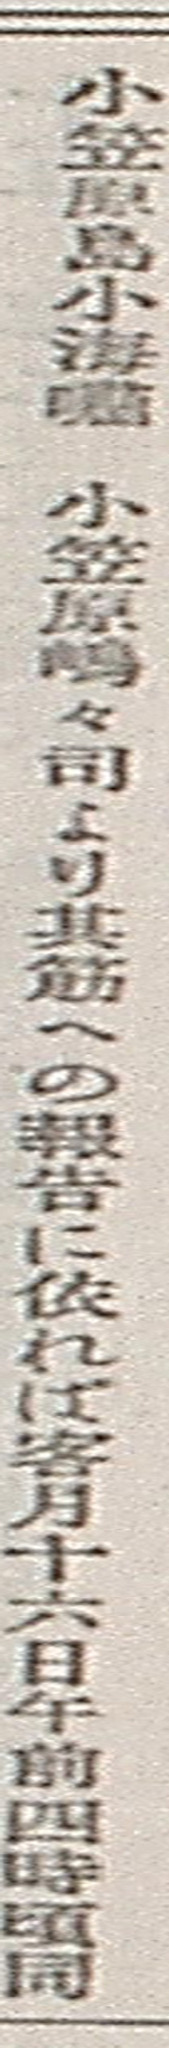小笠原島小海嘯小笠原嶋々司より其筋への報告に依れば客月十六日午前四時頃同
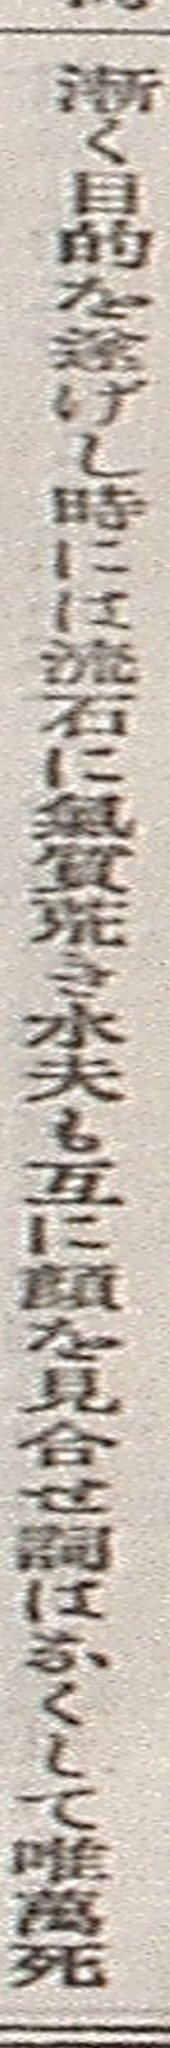漸く目的を遂げし時には流石に気質荒き水夫も互に顔を見合せ詞はなくして唯万死
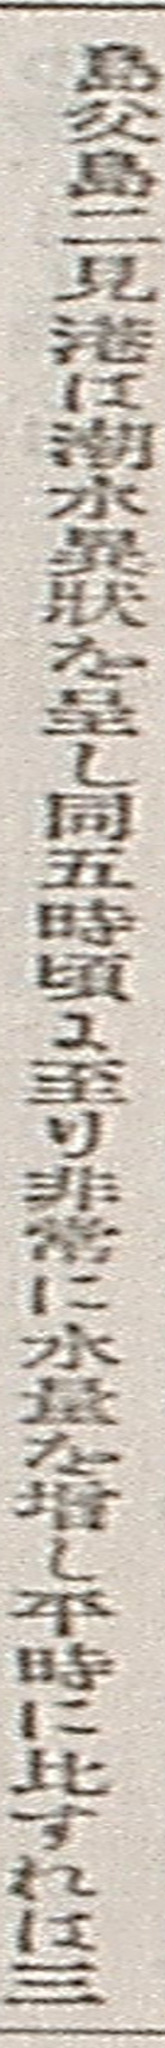島父島二見港は潮水異状を呈し同五時頃に至り非常に水量を増し平時に比すれば三
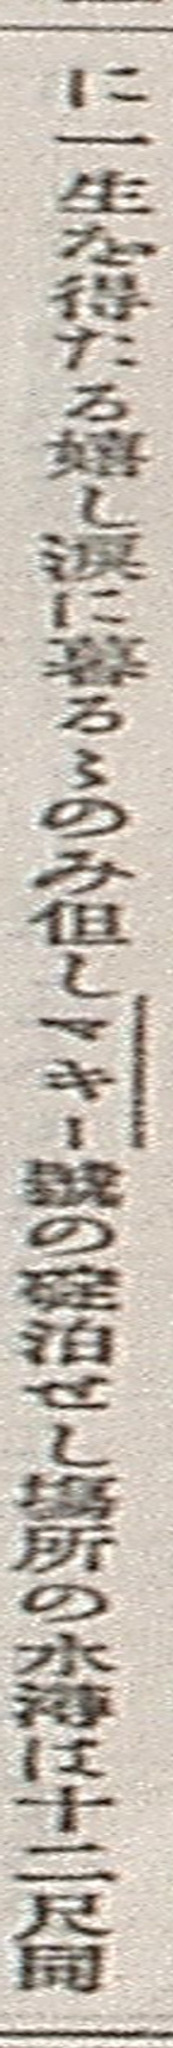に一生を得たる嬉し涙に暮るゝのみ但しマキー号の碇泊せし場所の水深は十二尺聞
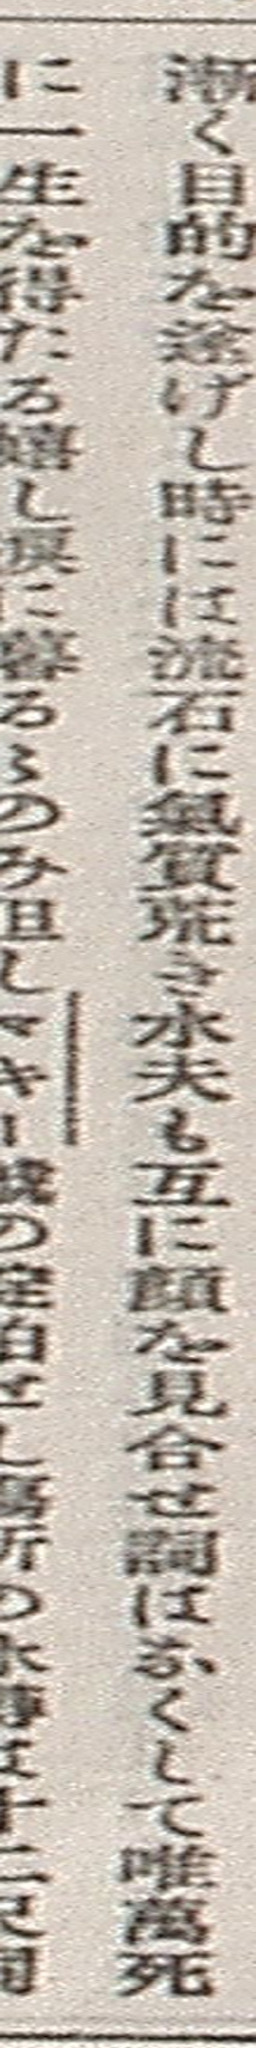に一生を得たる嬉し涙に暮るゝのみ但しマキー号の碇泊せし場所の水深は十二尺聞
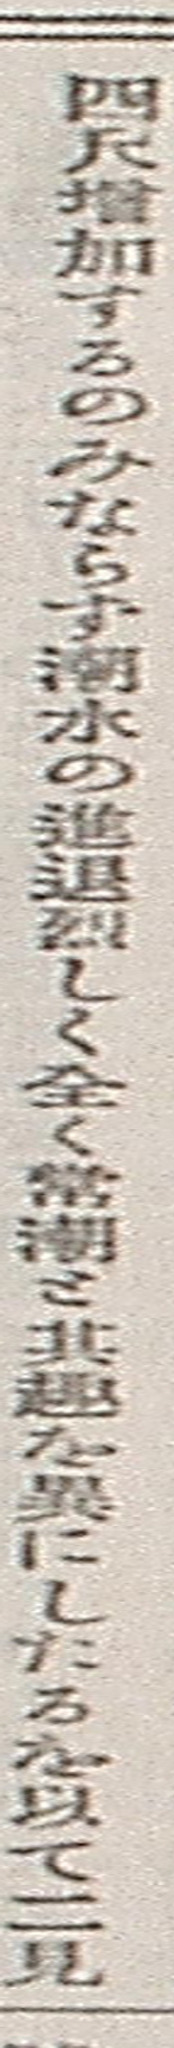四尺増加するのみならず潮水の進退烈しく全く常潮と其趣を異にしたるを以て二見
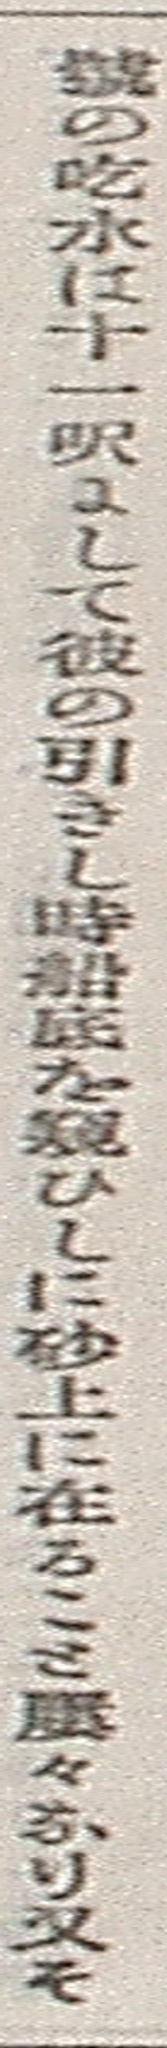号の吃水は十一尺にして彼の引きし時船底を窺ひしに砂上に在ること屡々なり又そ
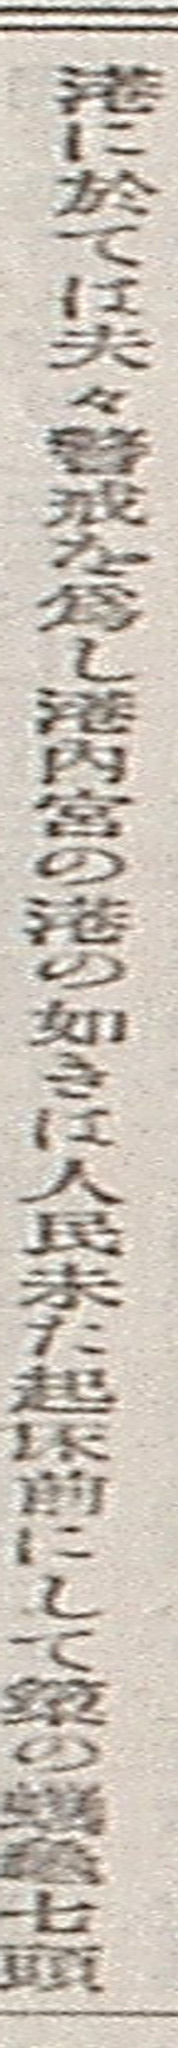港に於ては夫々警戒を為し港内宮の港の如きは人民未た起床前にして簗の蠵亀七頭
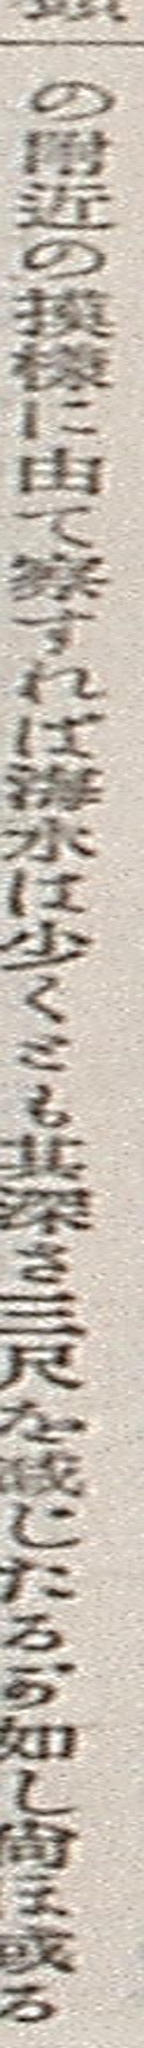の付近の模様に由て察すれば海水は少くとも其深さ三尺を減じたるが如し尚ほ或る
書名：風俗畫報臨時増刊第百十九號　大海嘯被害録（中）
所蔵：東京大学地震研究所図書室 Earthquake Research Institute Library, The University of Tokyo, JAPAN
